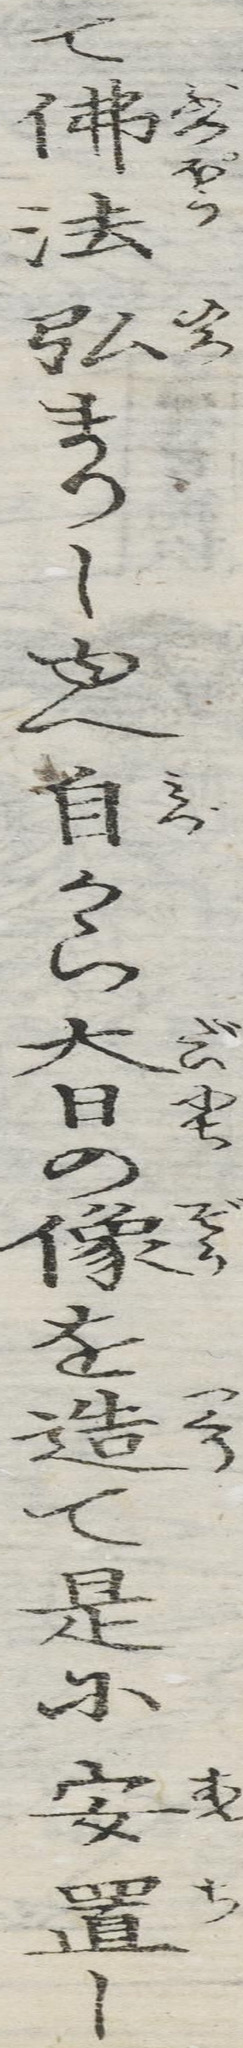て佛法弘まりしゆへ自から大日の像を造て是に安置し
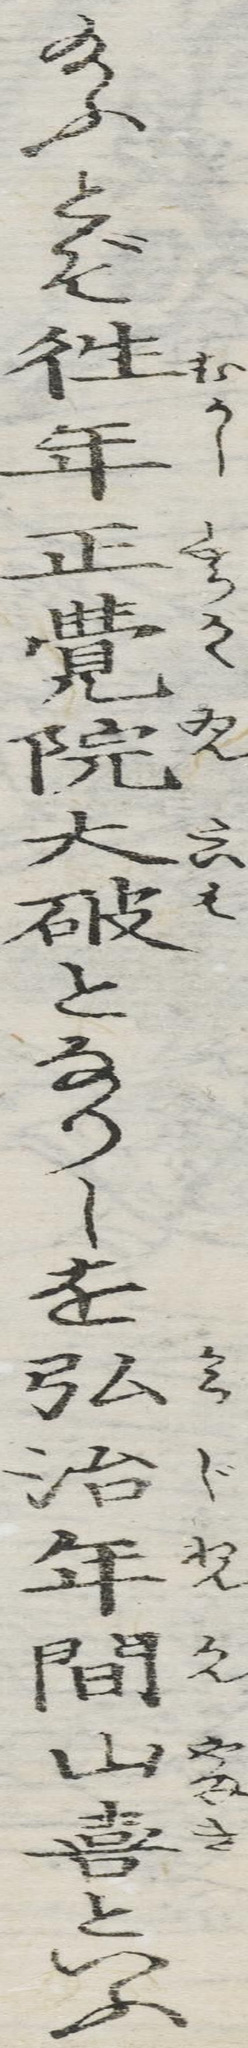給ふとぞ徃年正覚院大破となりしを弘治年間山喜といふ
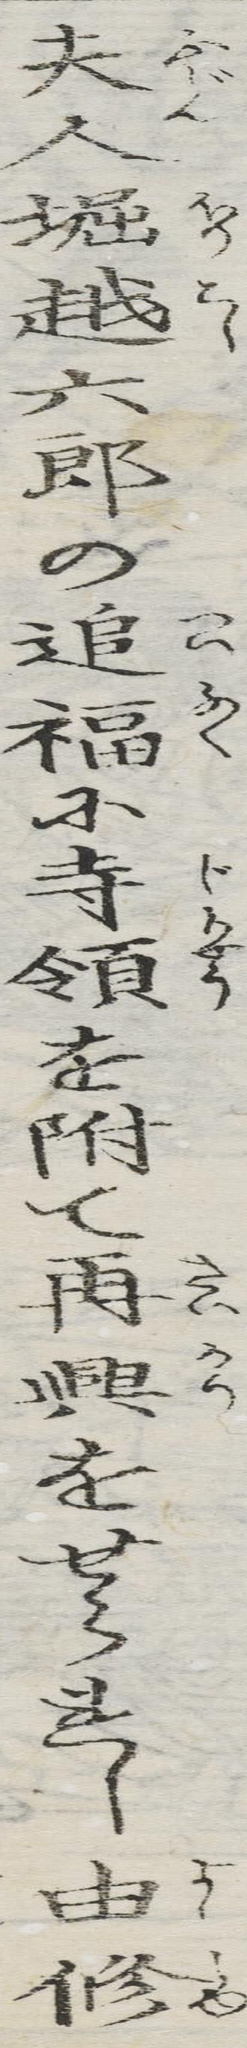夫人堀越六郎の追福に寺領を附て再興をせられて由修
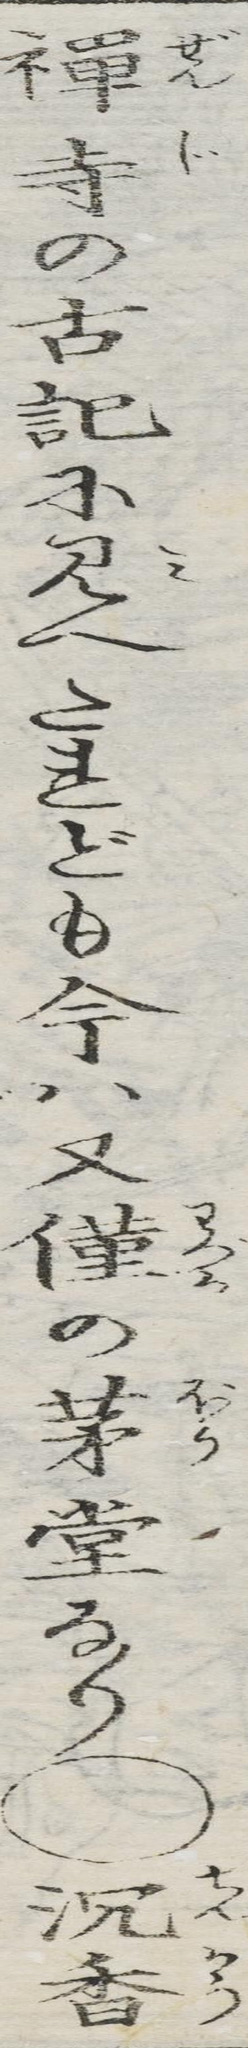禅寺の古記に見へたれども今ハ又僅の茅堂なり○沉香
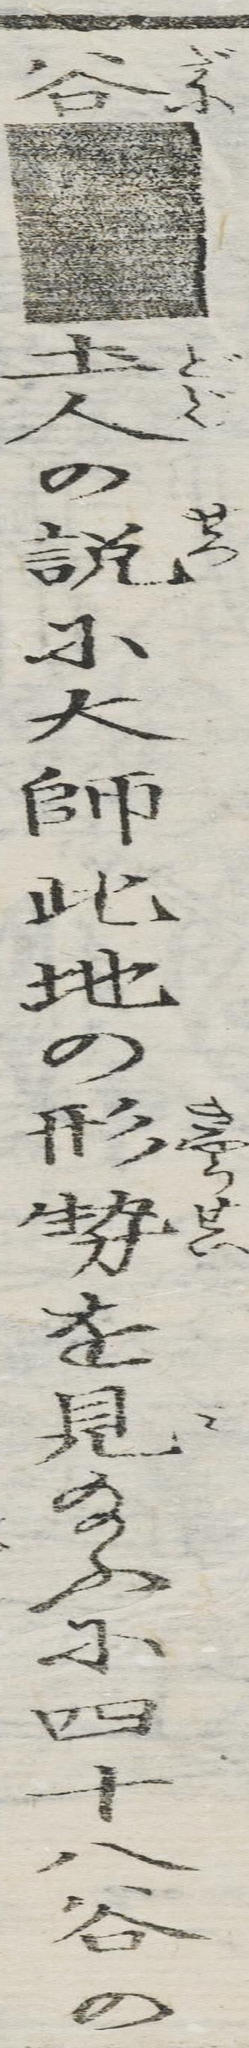谷土人の説に大師此地の形勢を見給ふに四十八谷の
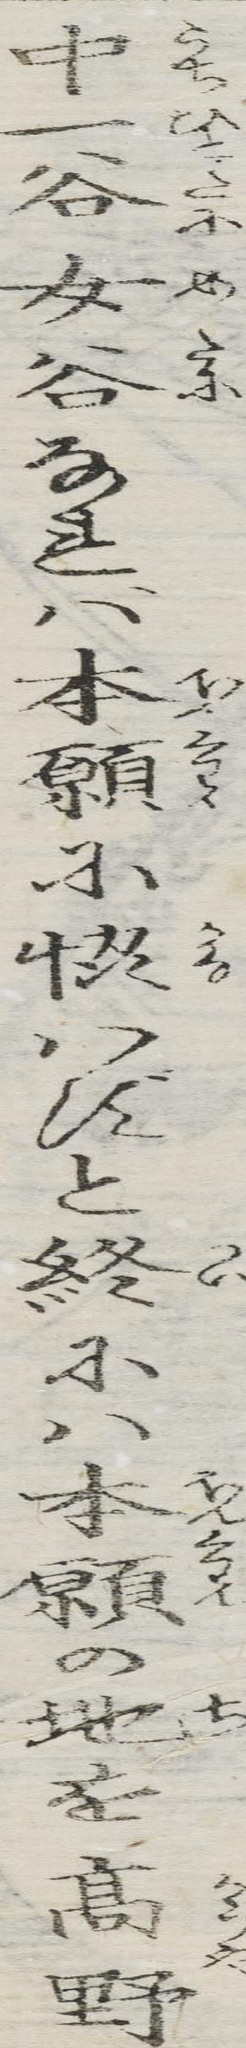中一谷女谷なれバ本願に協ハじと終にハ本願の地を高野
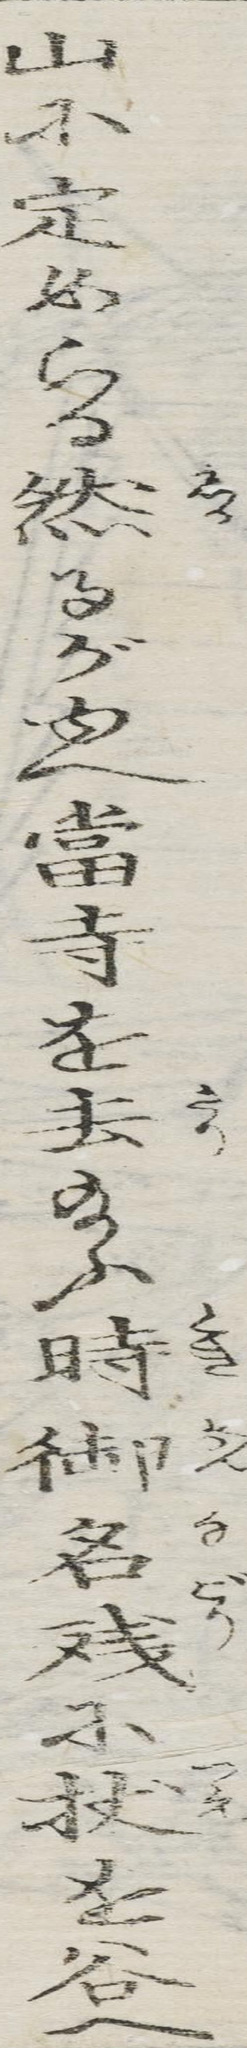山に定めらる然るがゆへ當寺を去給ふ時御名残に杖を谷へ
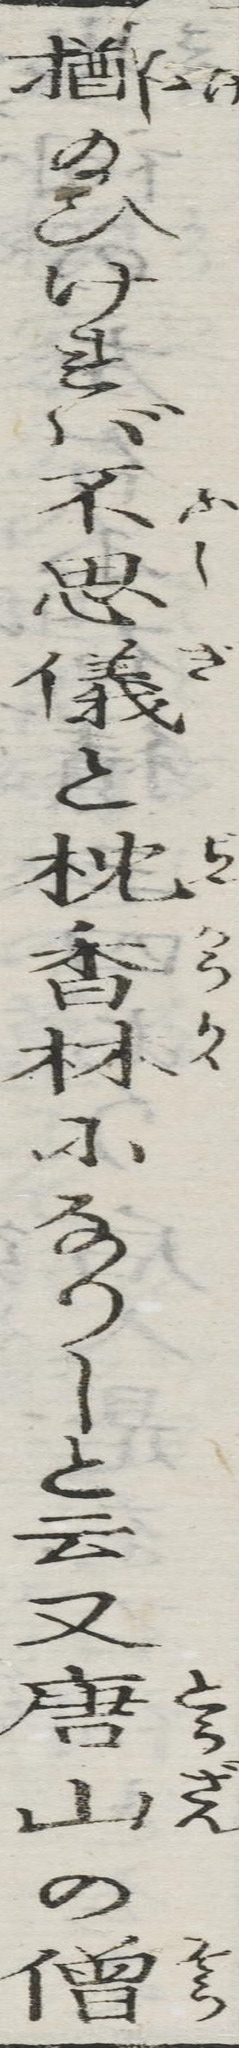擲給ひけれバ不思儀と枕香林になりしと云又唐山の僧
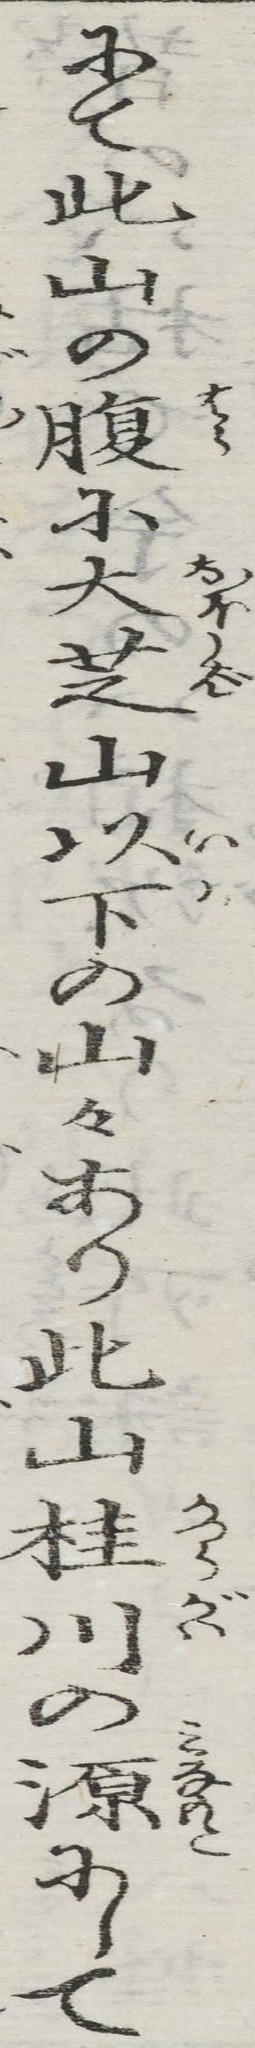にて此山の腹に大芝山以下の山々あり此山桂川の源にて
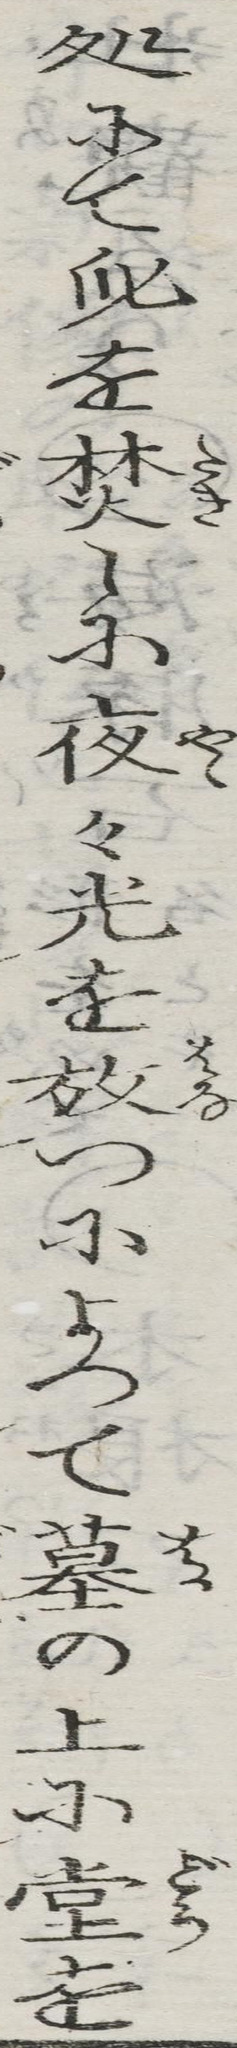処にて爪を焚しに夜々光を放つによつて墓の上に堂を
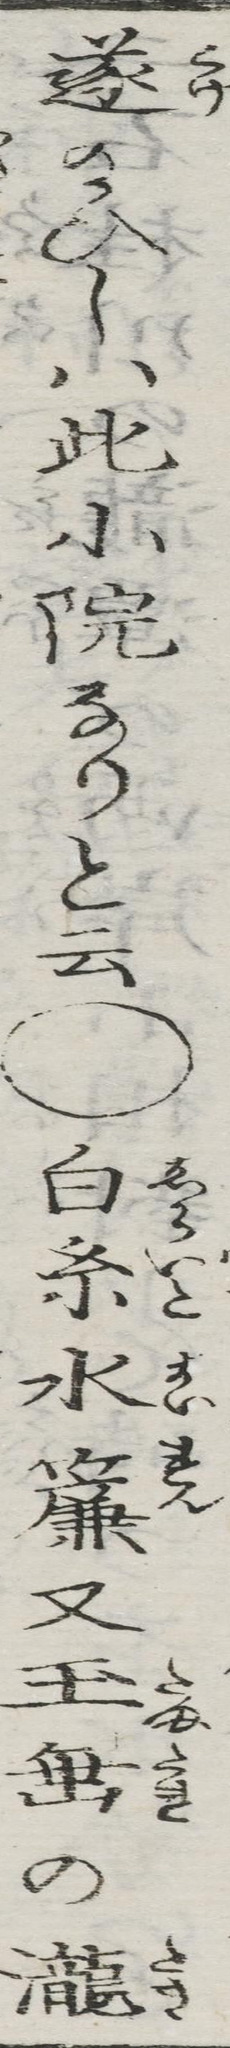遂給ひしハ此小院なりと云○白糸水簾又玉垂の瀧

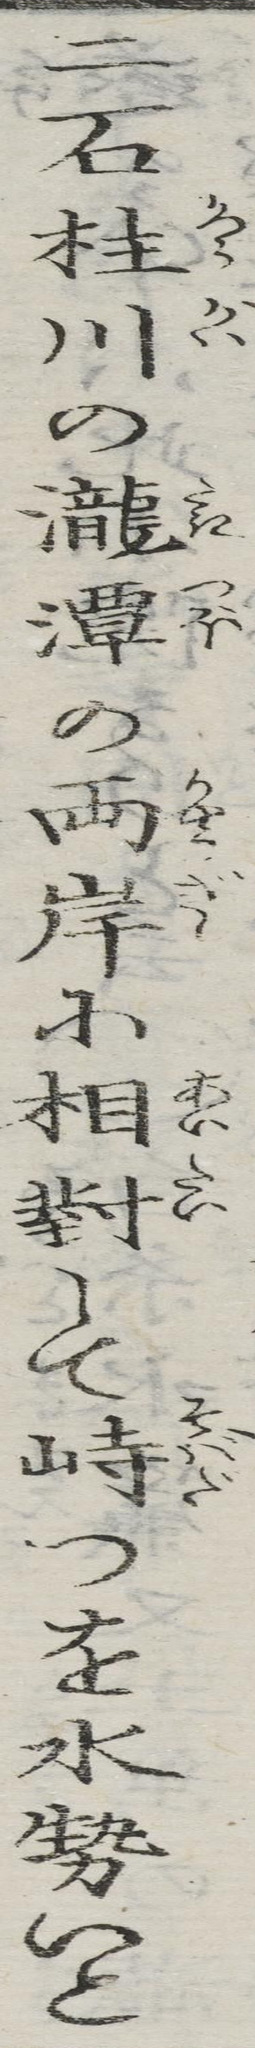二石桂川の瀧潭の両岸に相対して峙つを水勢いと
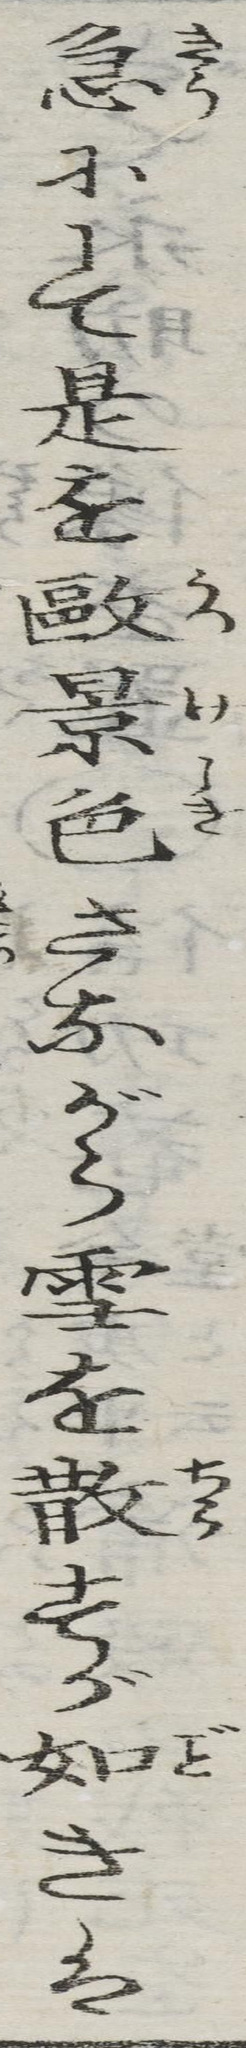急にして是を歐景色さながら雪を散すが如きは
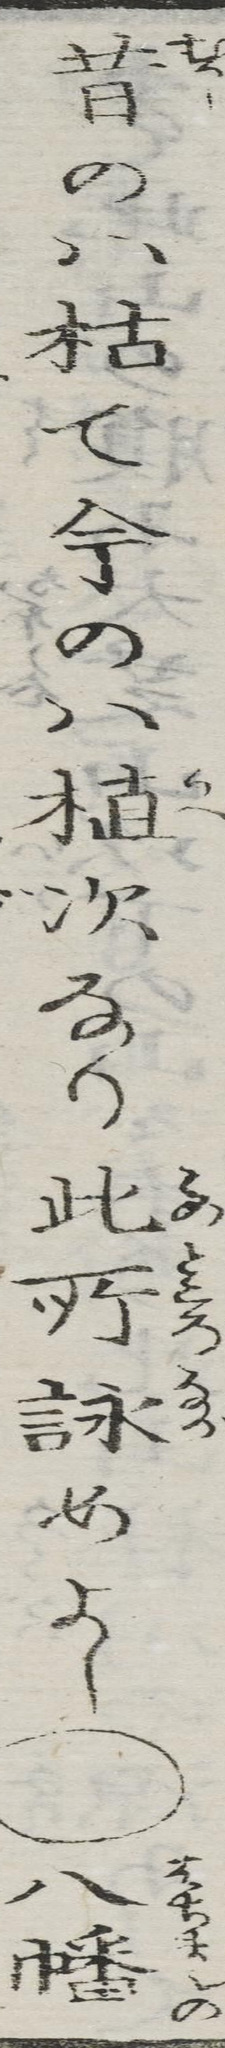昔のは枯て今のは植次なり此所詠めよし〇八幡
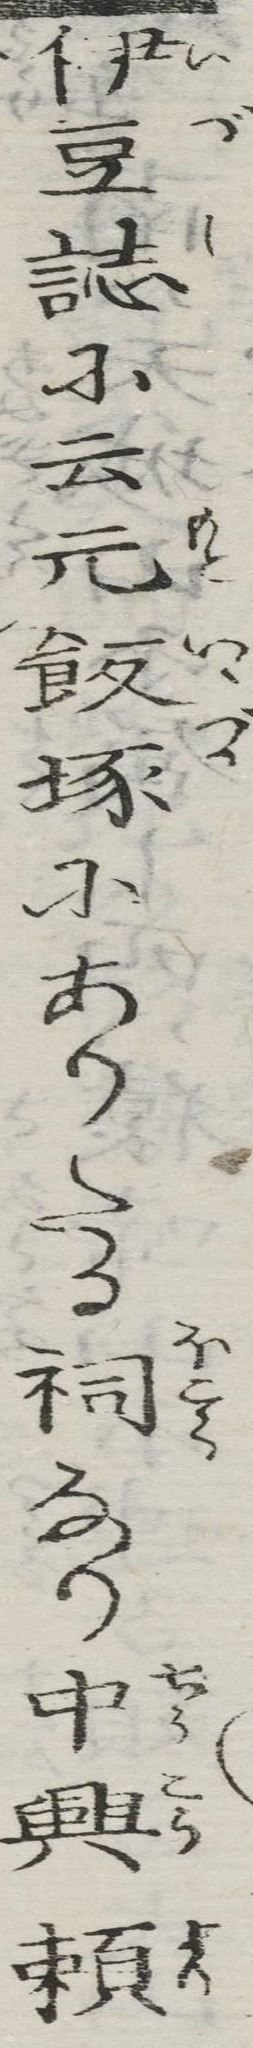宮伊豆誌に云元飯塚にありたる祠なり中興頼
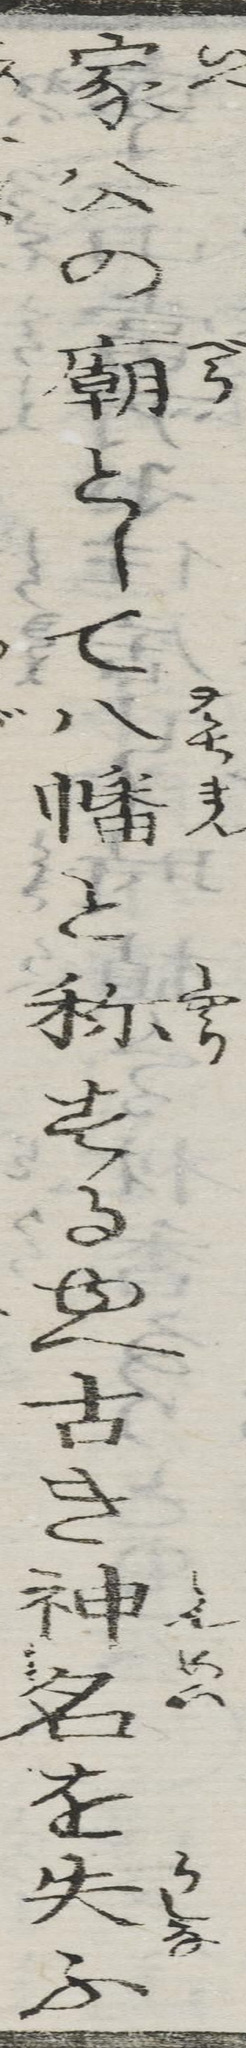家公の廟として八幡と称するゆへ古き神名を失ふ
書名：伊豆国修善寺温泉名所記　全
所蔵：東京大学地震研究所図書室 Earthquake Research Institute Library, The University of Tokyo, JAPAN
